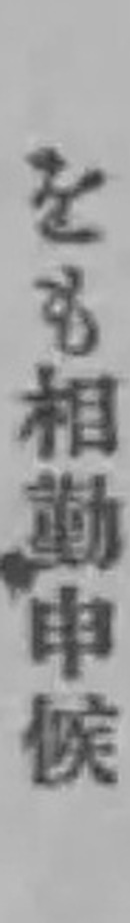をも相勤申候
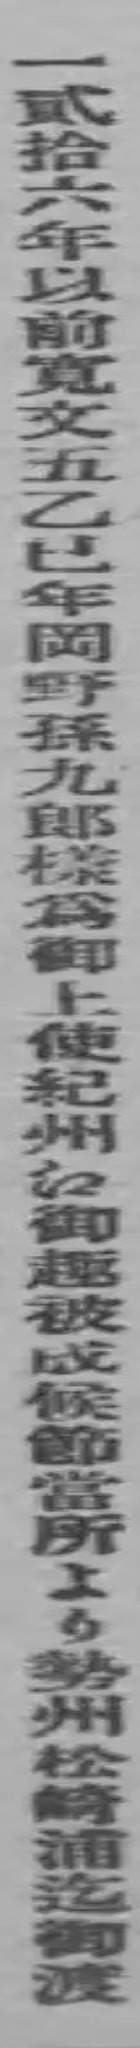一弐拾六年以前寛文五乙巳年岡野孫九郎様為御上使紀州え御趣被成候節当所より勢州松崎浦迄御渡
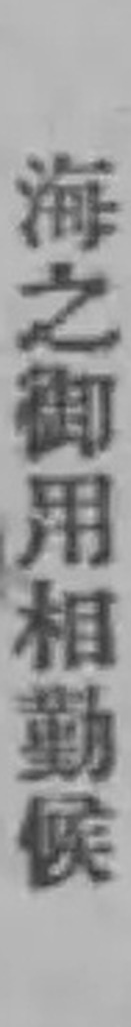海之御用相勤候
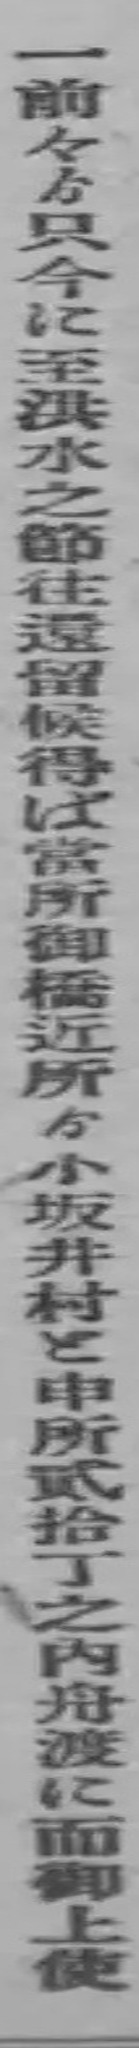一前々ゟ只今に至洪水之節往還留候得ば当所御橋近所ゟ小坂井村と申所弐拾丁之内舟渡に而御上使
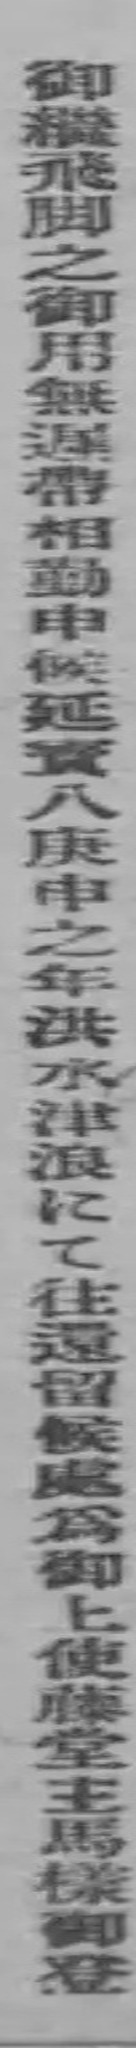御継飛脚之御用無遅滞相勤申候延宝八庚申之年洪水津浪にて往還留候処為御上使藤堂主馬様御登
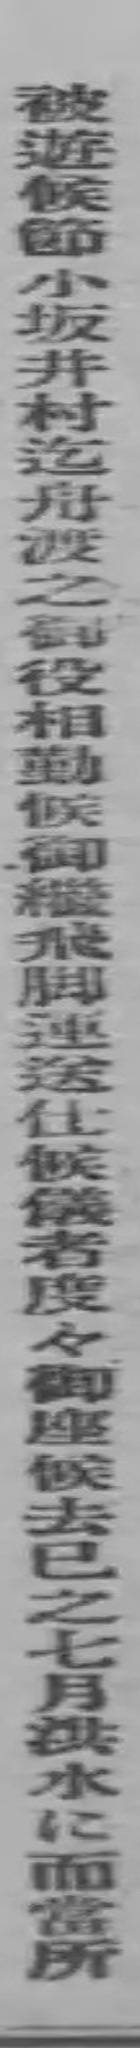被遊候節小坂井村迄舟渡之御役相勤候御継飛脚運送仕候儀者度々御座候去巳之七月洪水に而当所
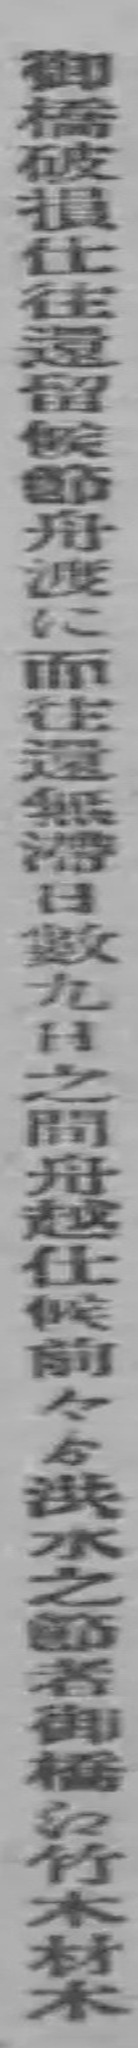御橋破損仕往還留候節舟渡に而往還無滞日数九日之間舟越仕候前々ゟ洪水之節者御橋え竹木材木
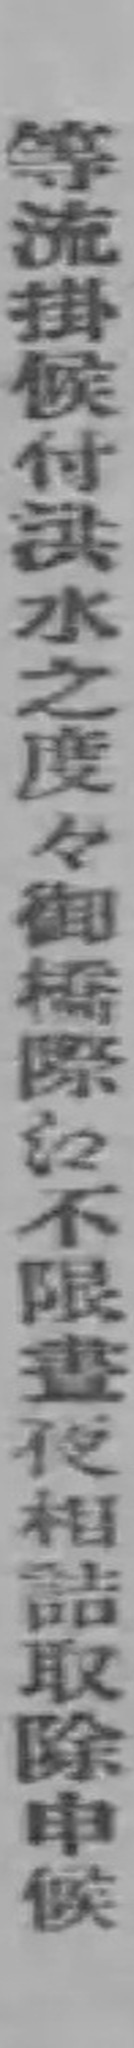等流掛候付洪水之度々御橋際え不限昼夜相詰取除申候
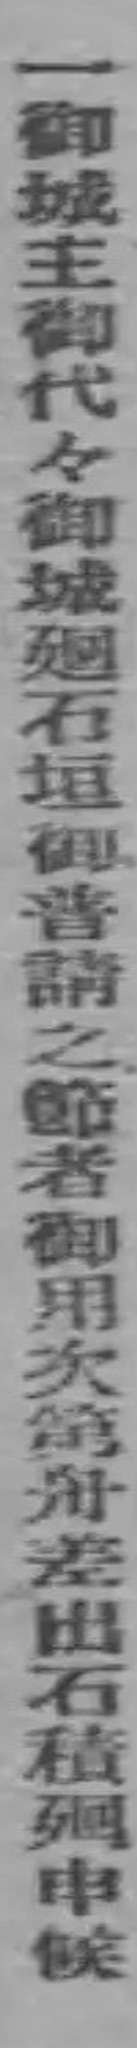一御城主御代々御城廻石垣御普請之節者御用次第舟差出石積廻申候

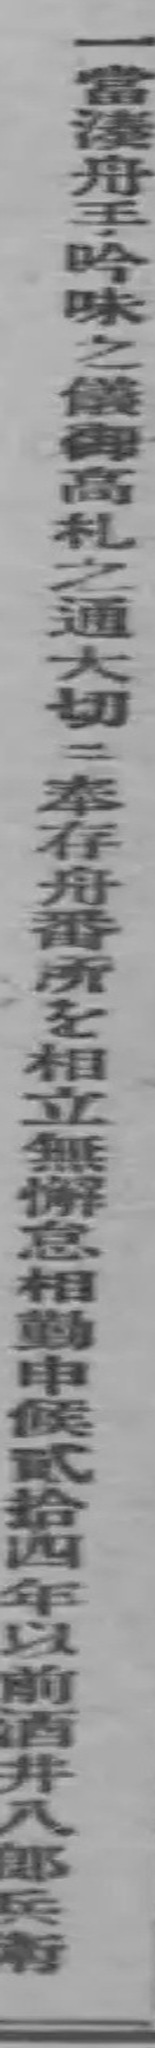一当湊舟王吟味之儀御高札之通大切ニ奉存舟番所を相立無懈怠相勤申候弐拾四年以前酒井八郎兵衛
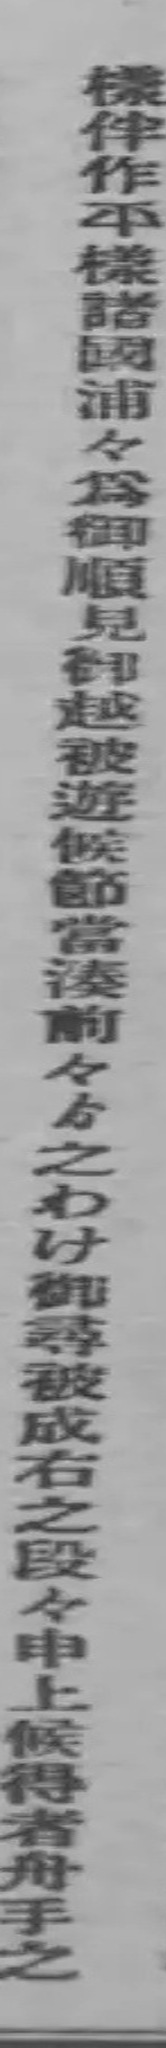様伴作平様諸国浦々為御順見御越被遊候節当湊前々ゟ之わけ御尋被成右之段々申上候得者舟手之
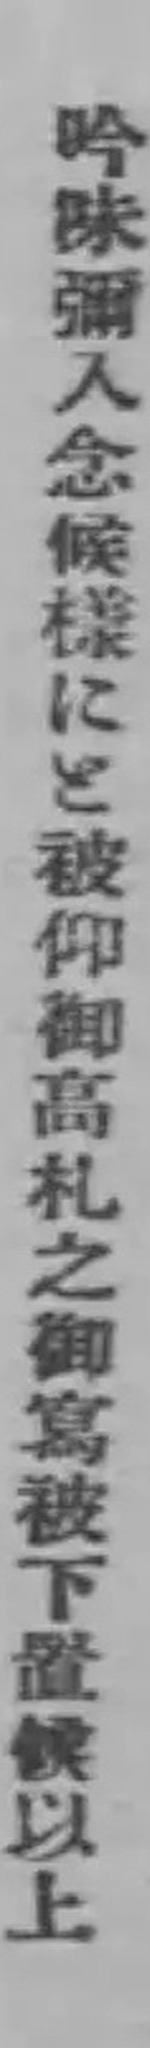吟味弥入念候様にと被仰御高札之御写被下置候以上
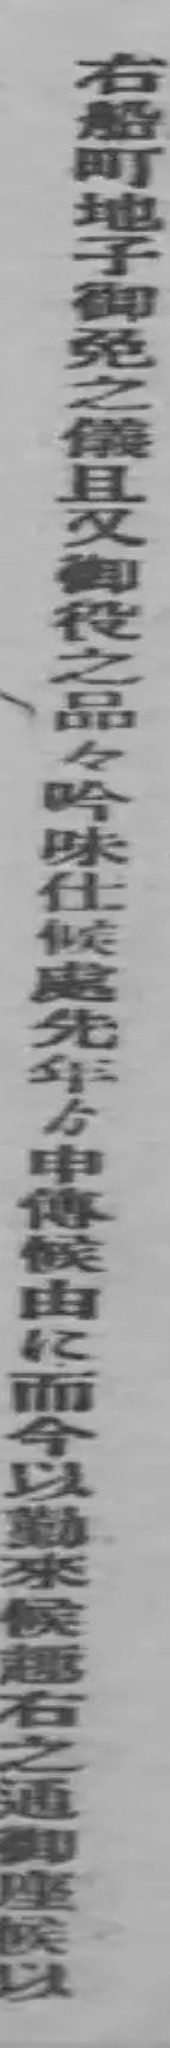右船町地子御免之儀且又御役之品々吟味仕候処先年ゟ申伝候由に而今以勤来候趣右之通御座候以
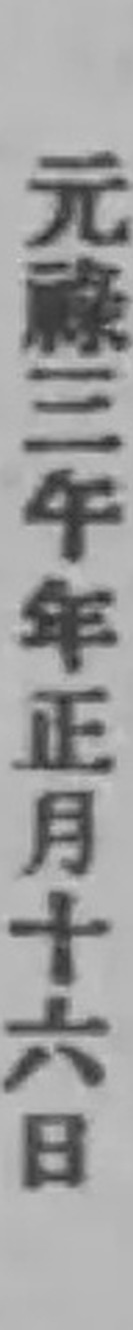元禄三午年正月十六日
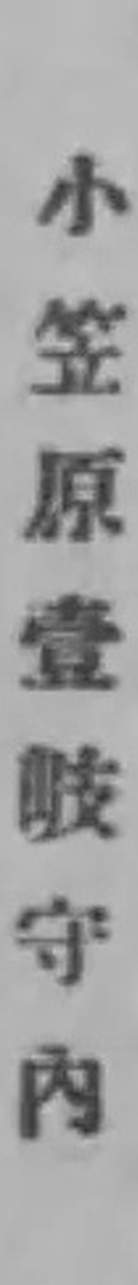小笠原壱岐守内
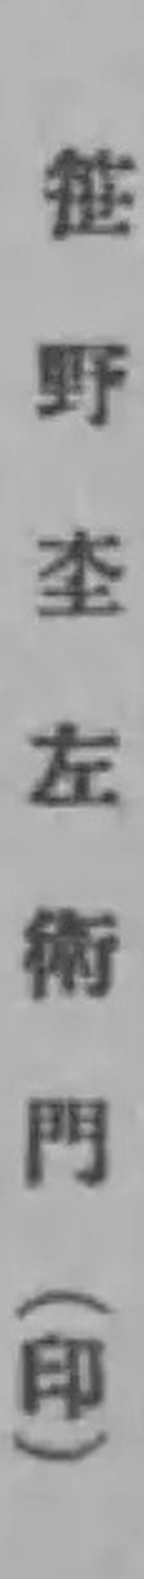笹野杢左衛門(印)
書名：豊橋市史談
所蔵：国立国会図書館 National Diet Library, JAPAN
